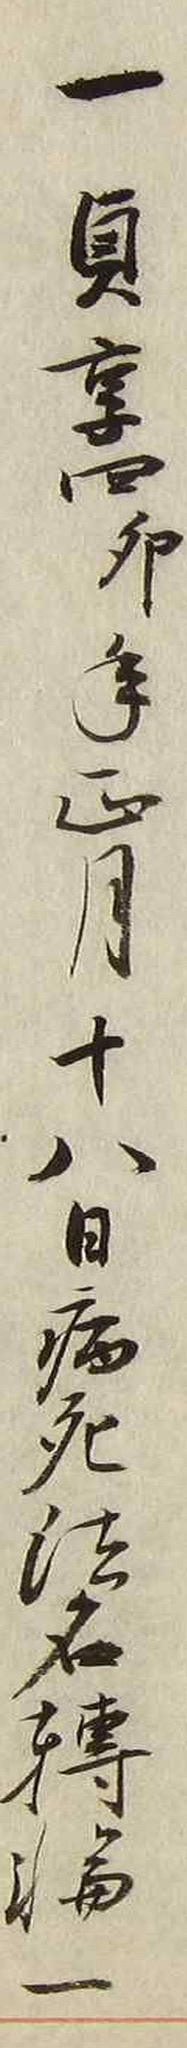一貞享四卯年正月十八日病死法名転輪一
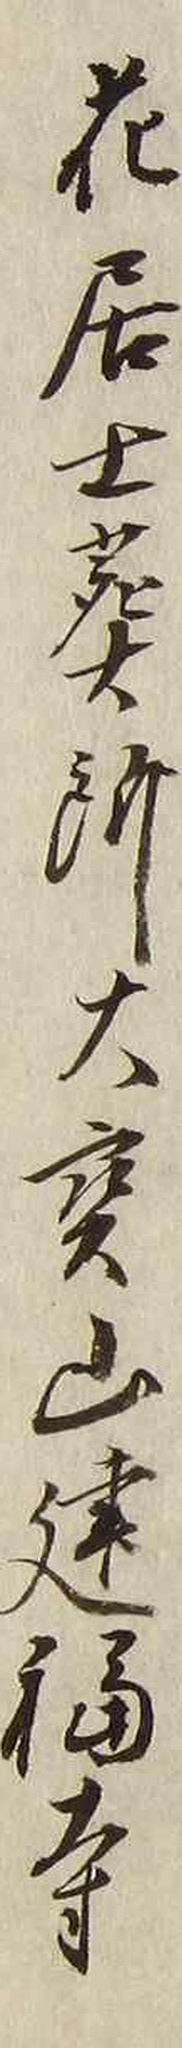花居士葬所大窪山建福寺

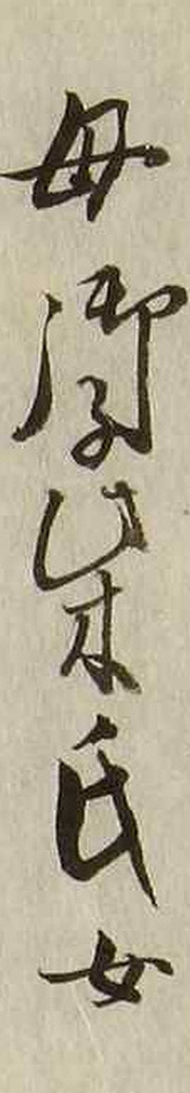母御子柴氏女
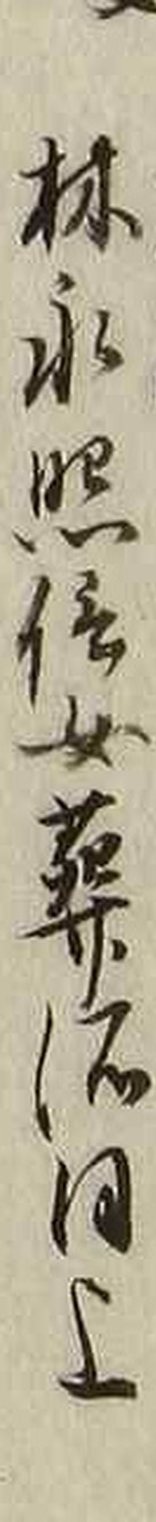林永照信女葬所同上
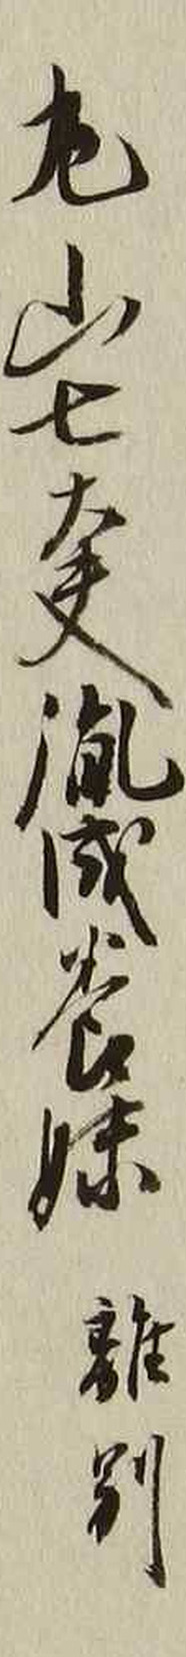丸山七大夫胤成養妹離別
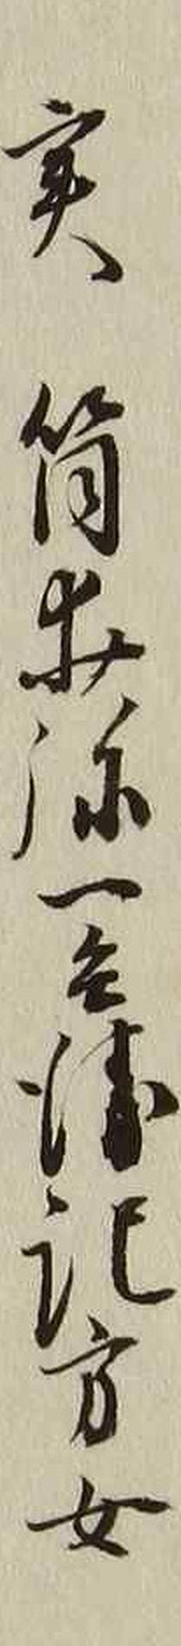実筒井弥一兵衛記方女
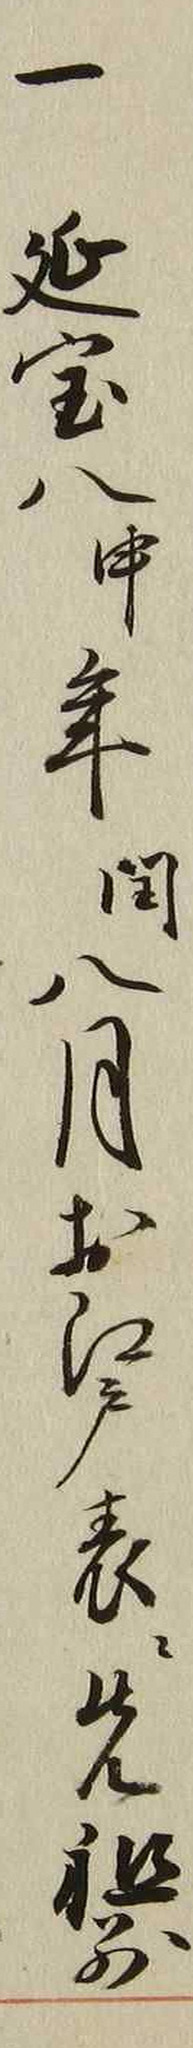一延宝八申年閏八月於江戸表ニ先祖別
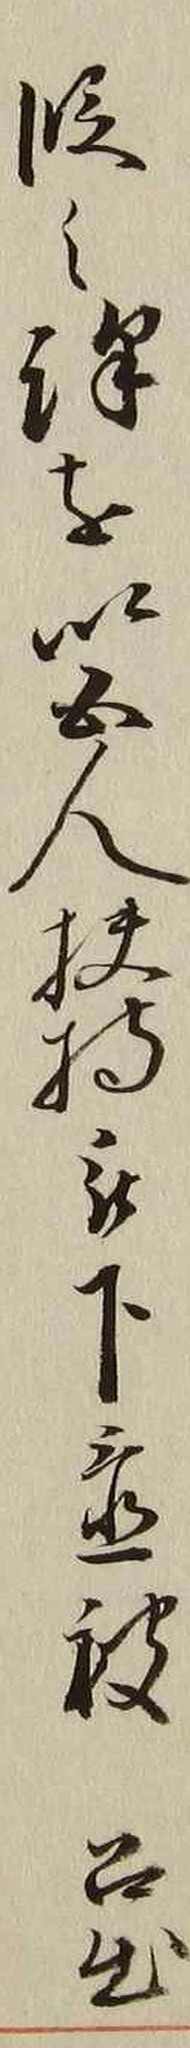段之訳を以五人扶持被下置被召出
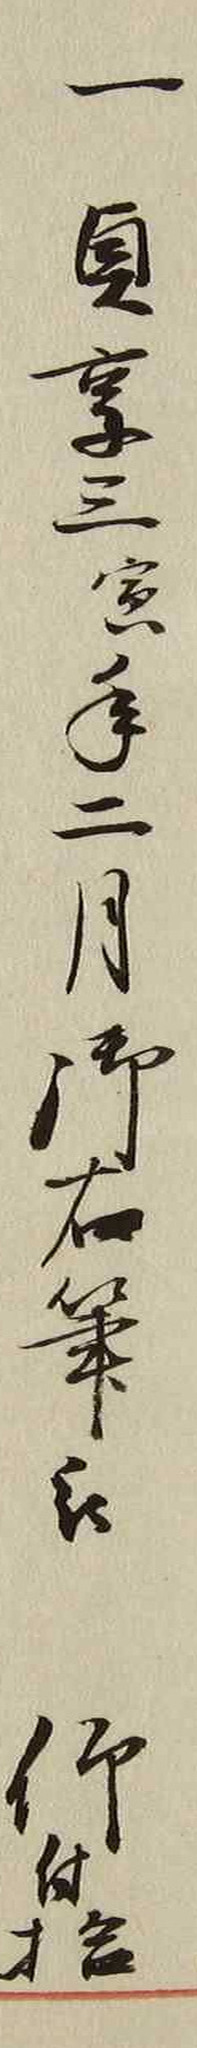一貞享三寅年二月御右筆被仰付拾
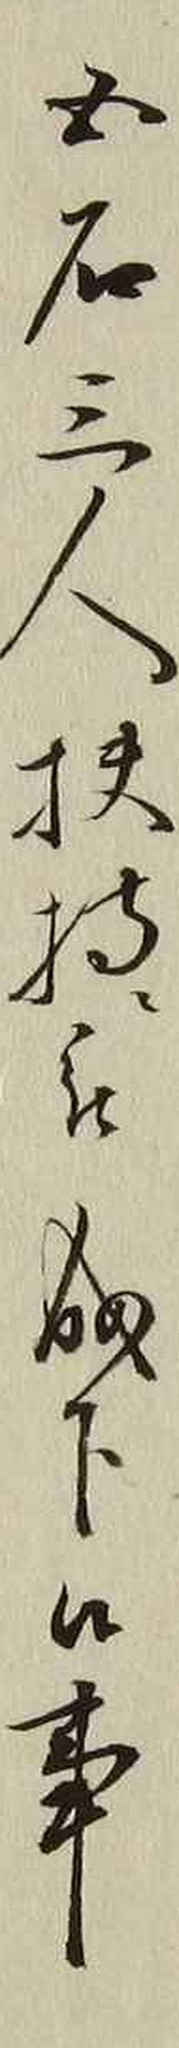五石三人扶持ニ被成下候事
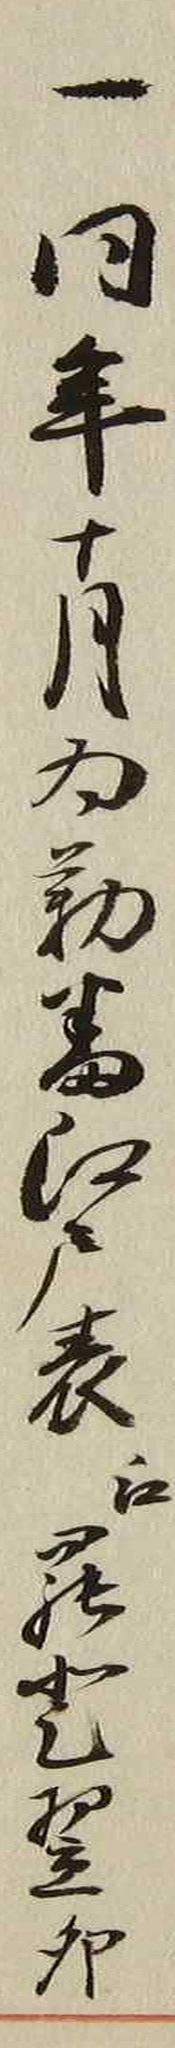一同年十月為勤番江戸表江罷登翌卯
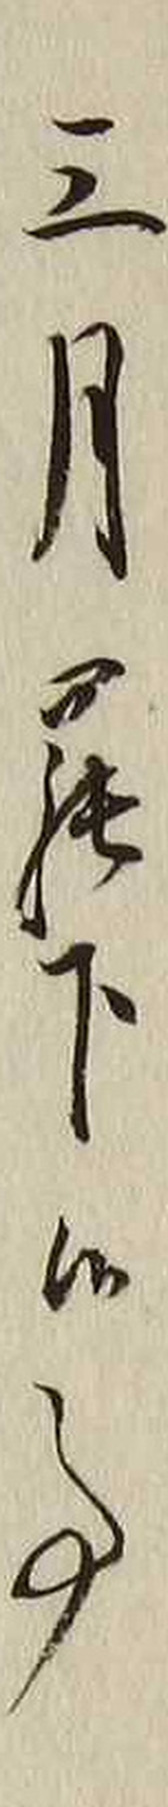三月罷下候事
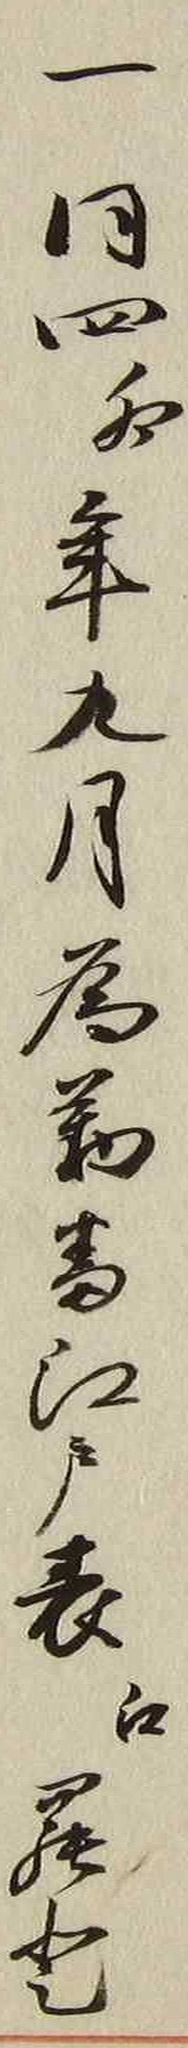一同四卯年九月為勤番江戸表江罷登
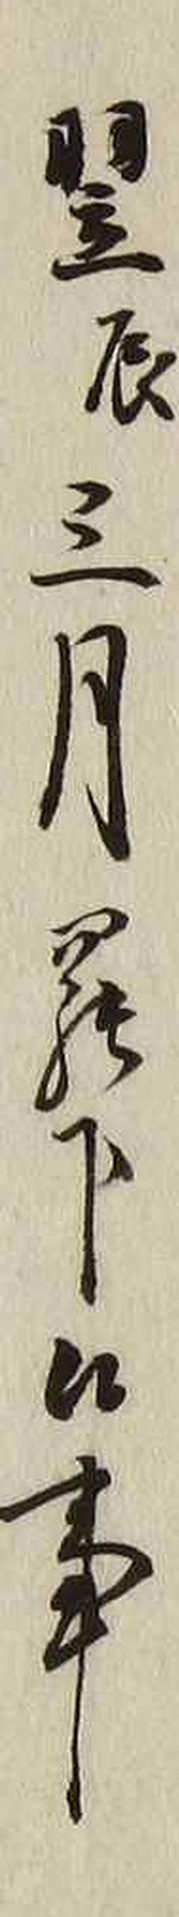翌辰三月罷下候事
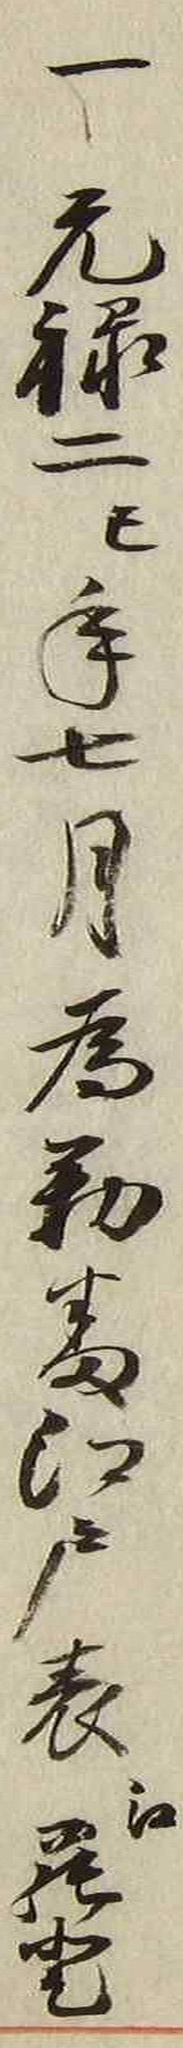一元禄二巳年七月為勤番江戸表江罷登
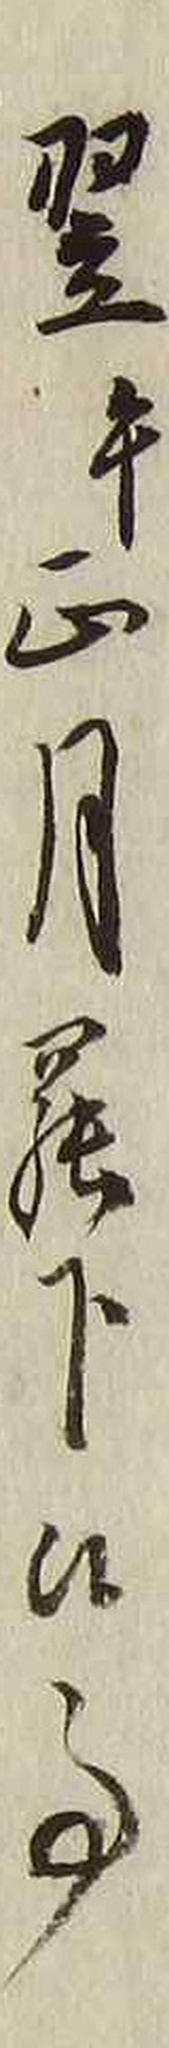翌午正月罷下候事
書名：諸士系譜　巻之22　い之部22
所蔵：会津若松市立会津図書館
